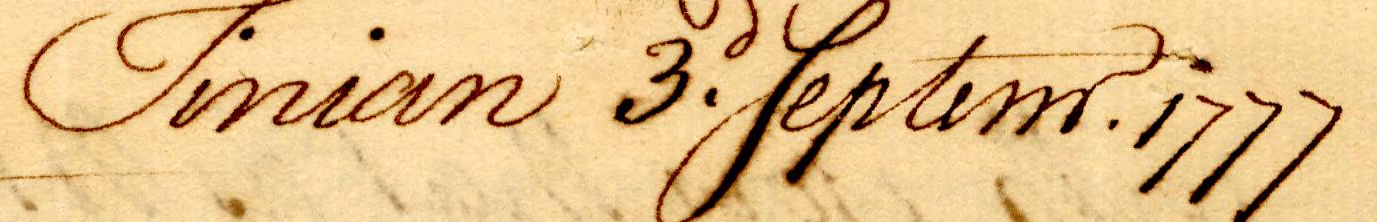Tinian 3d. Septem. 1777
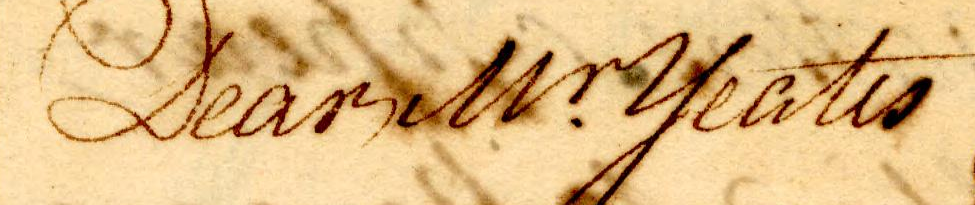Dear M^r. Yeates
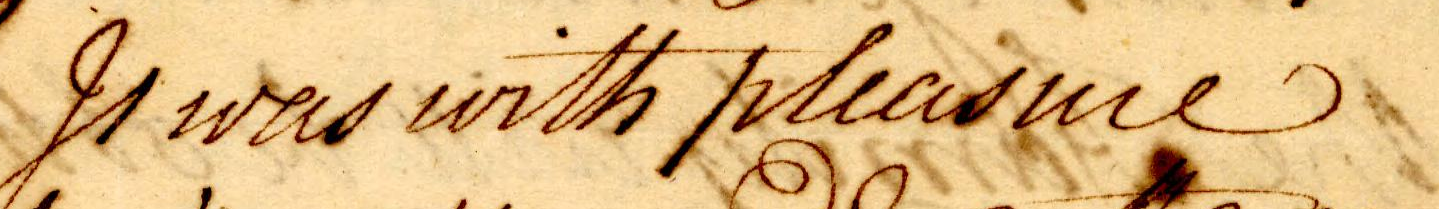It was with pleasure
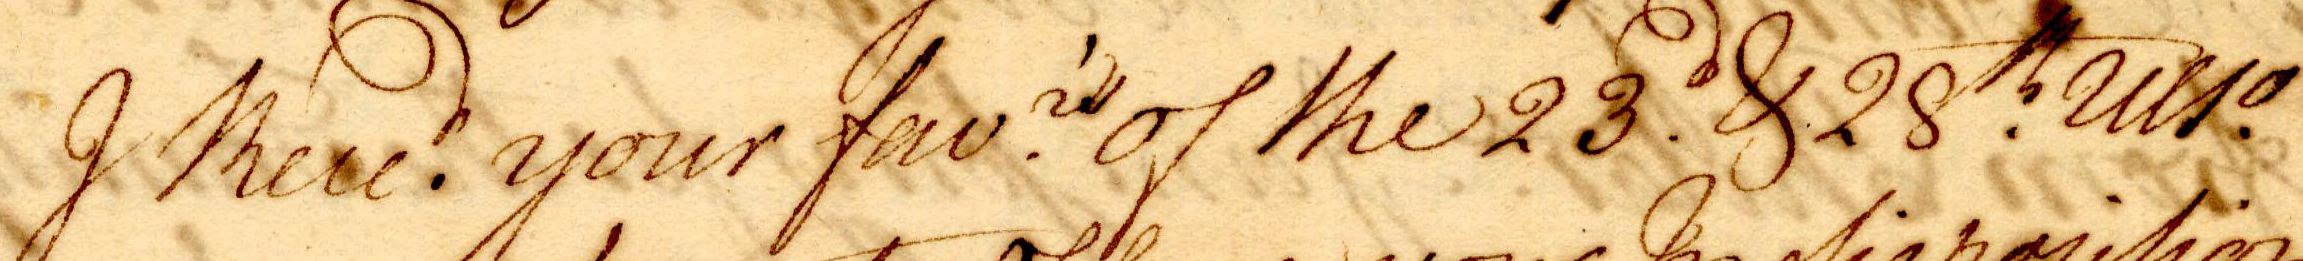I Rece^d. your fav^r. of the 23^d. & 28^th Ult^o.
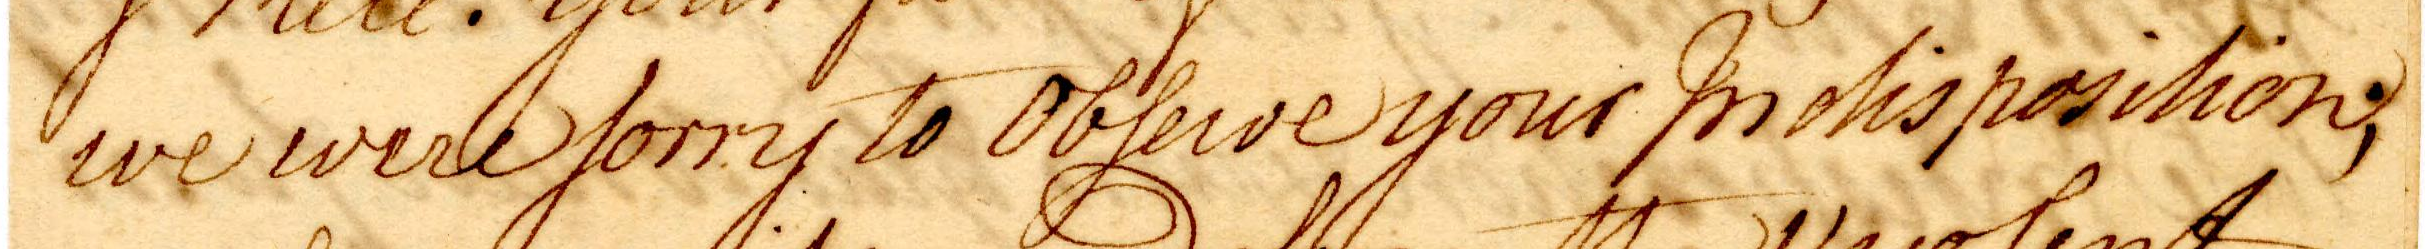we were sorry to Observe your Indisposition;
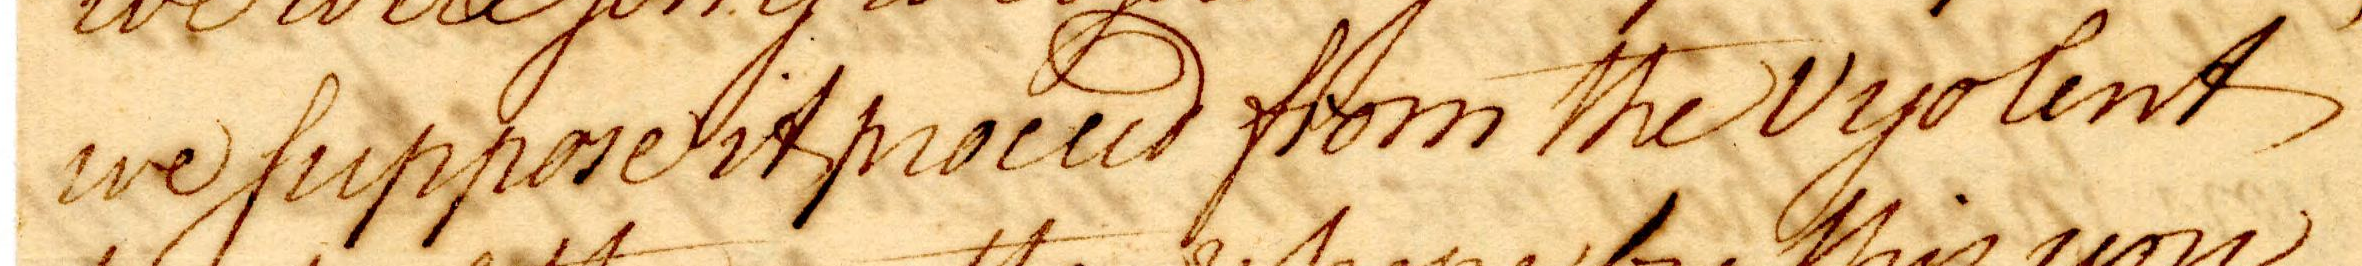we suppose it proceed from the Vyolent
